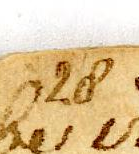28
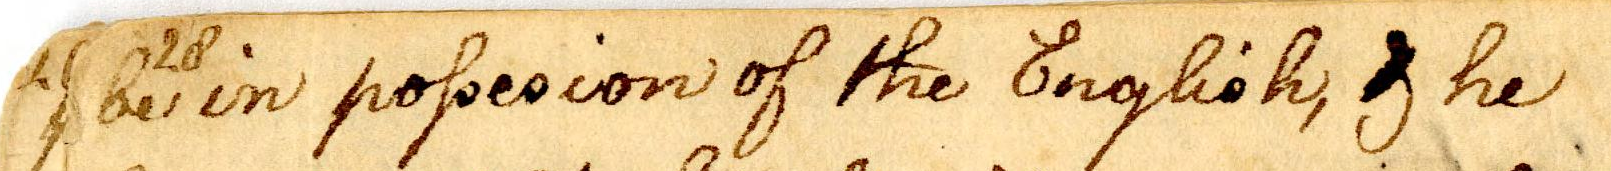be in possesion of the English, & he
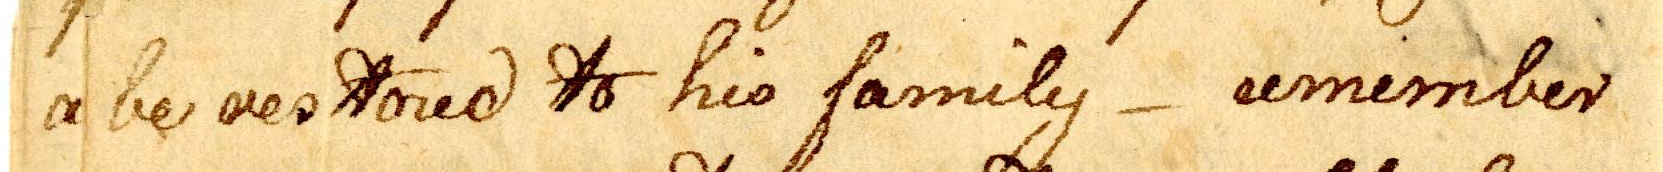be restored to his family- remember
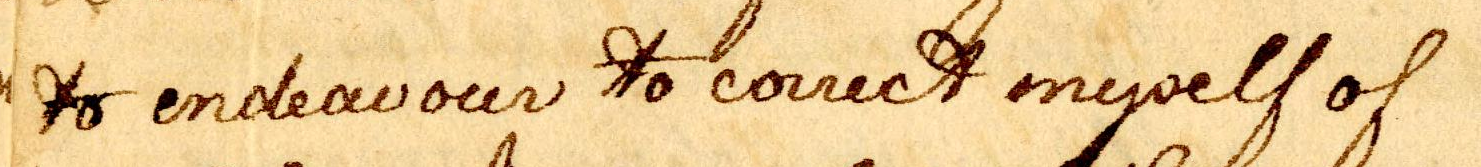to endeavour to correct myself of
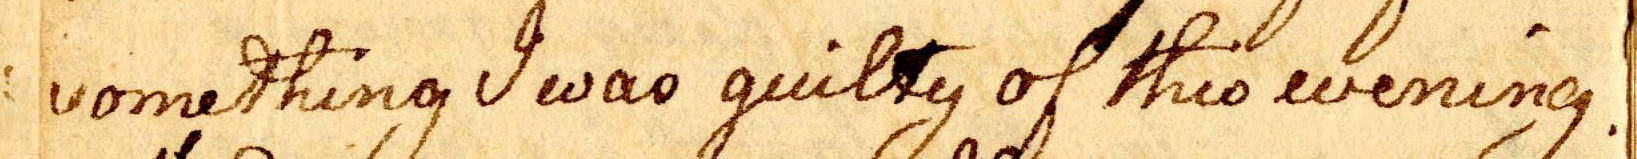something I was guilty of this evening
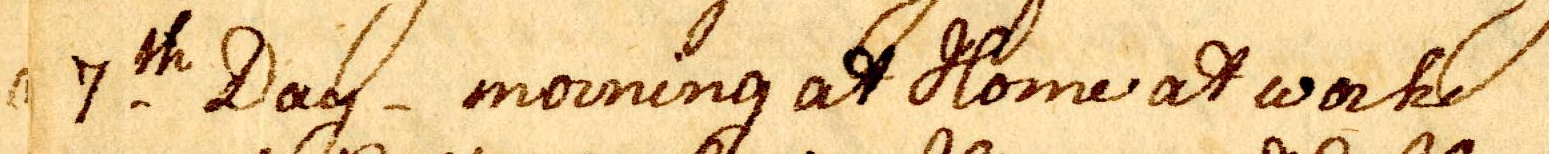7^th Day- morning at Home at worke
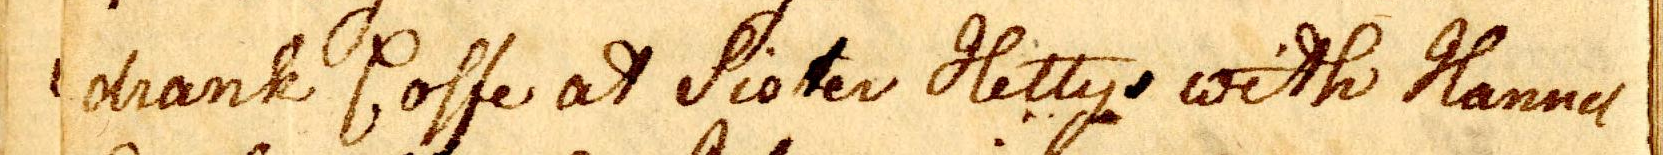drank Coffe at Sister Hettys with Hanna
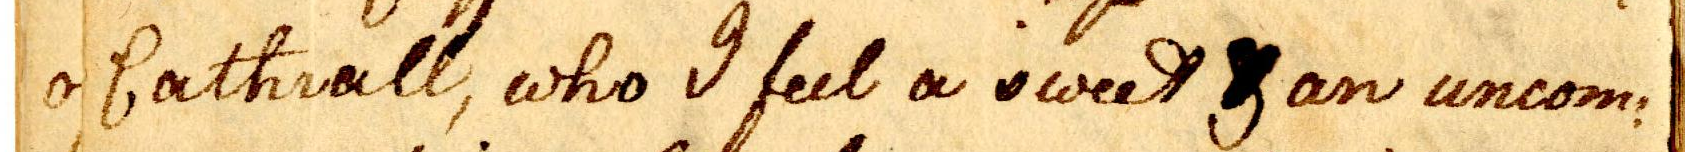Cathrall, who I feel a sweet & an uncom
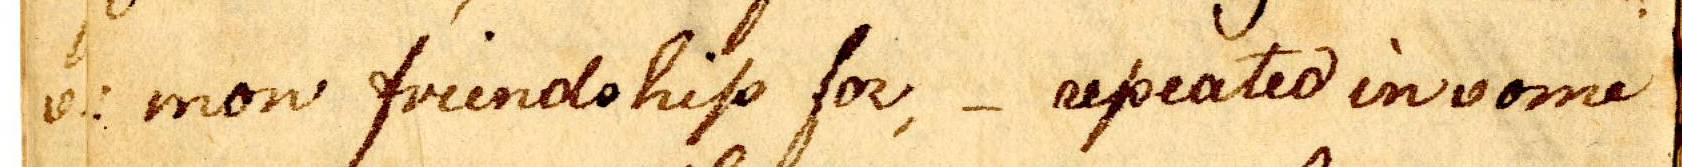-mon friendship for- repeated in some
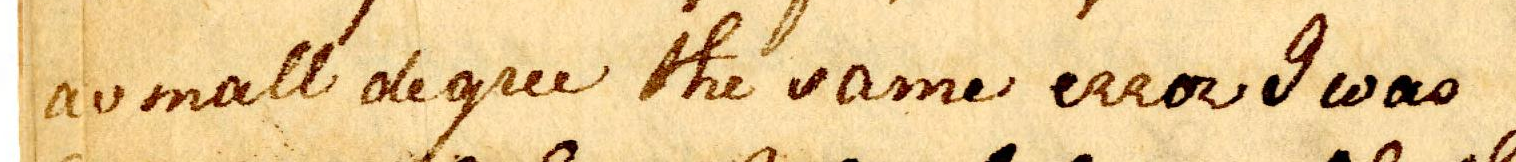small degree the same error I was
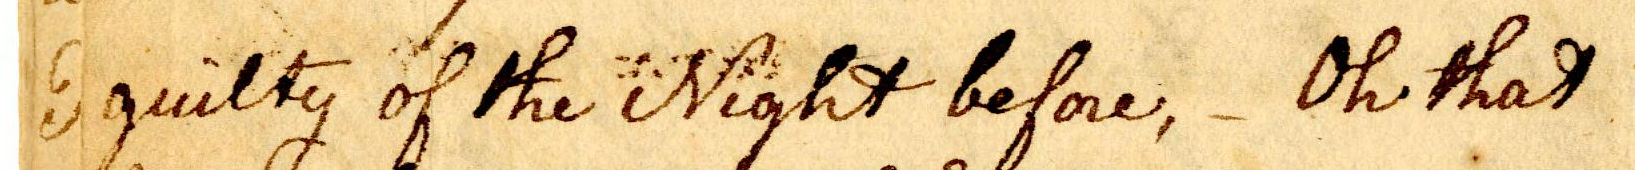guilty of the Night before- Oh that
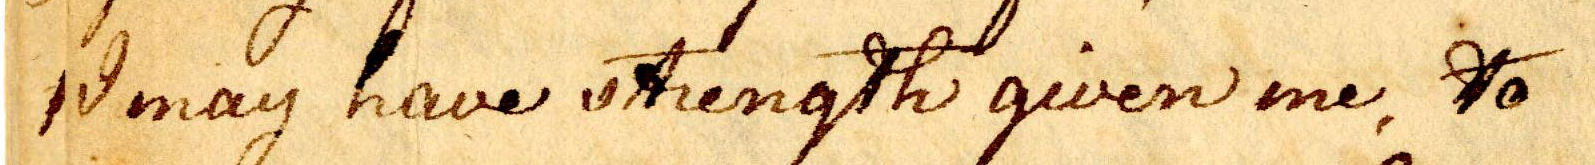I may have strength given me, to
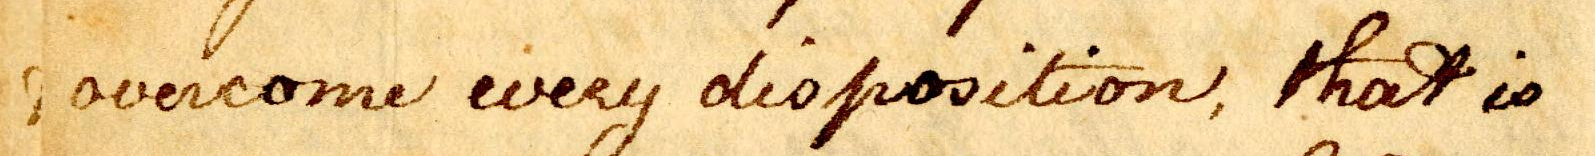overcome every disposition, that is
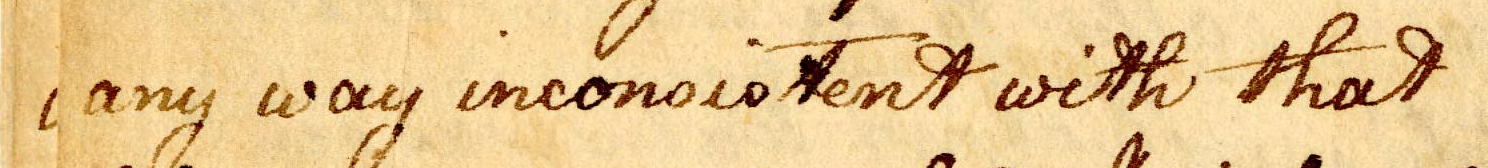any way inconsistent with that
